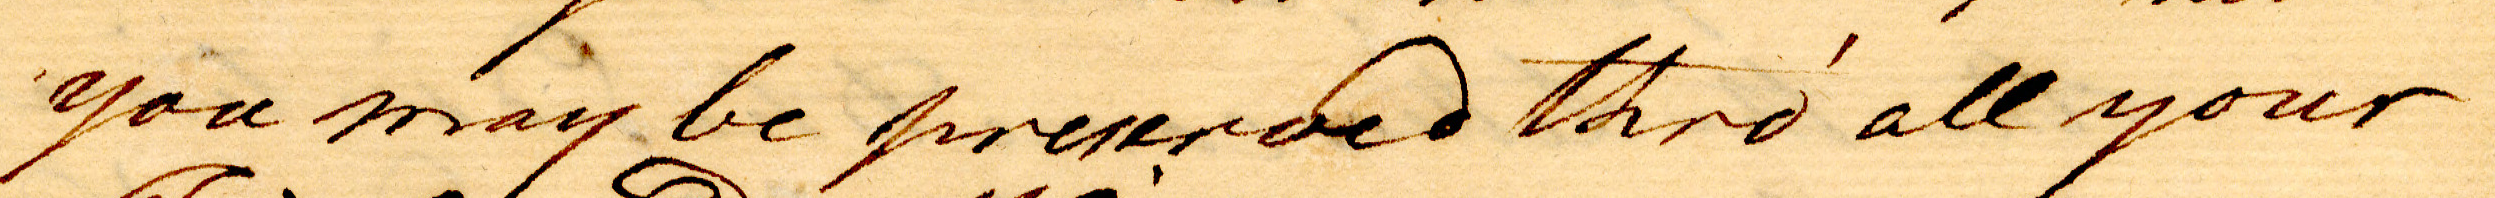you may be preserved thro' all your
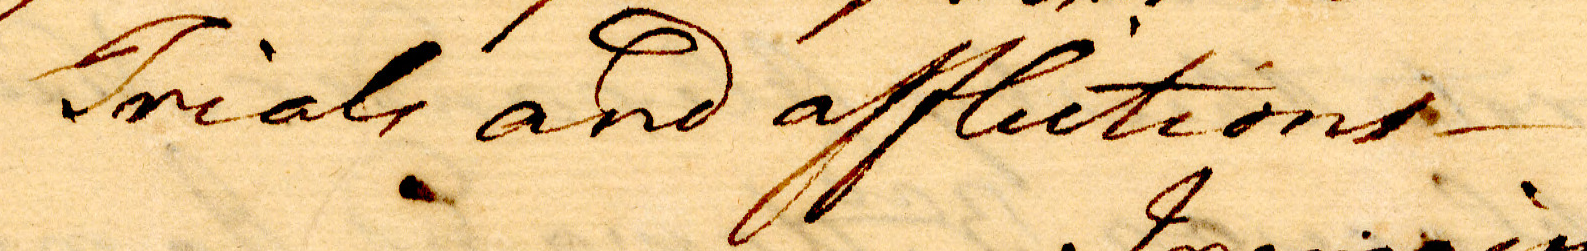Trials and afflictions-
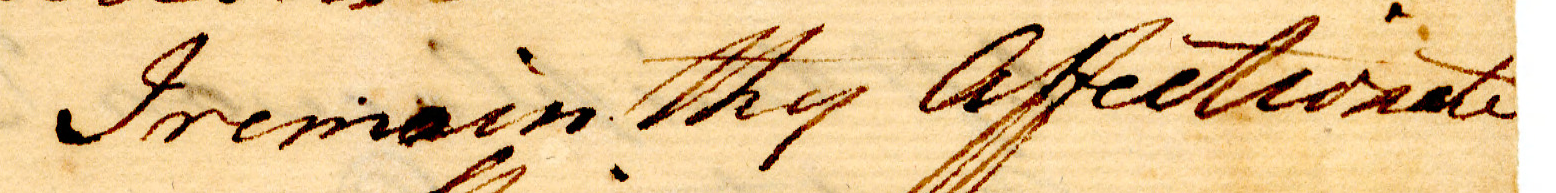I remain thy Affectionate
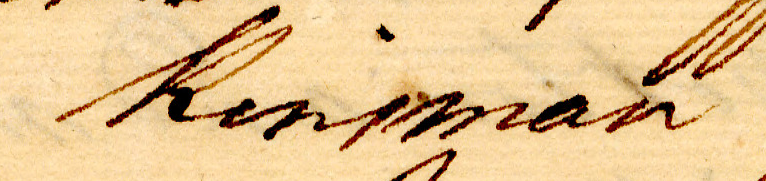Kinsman
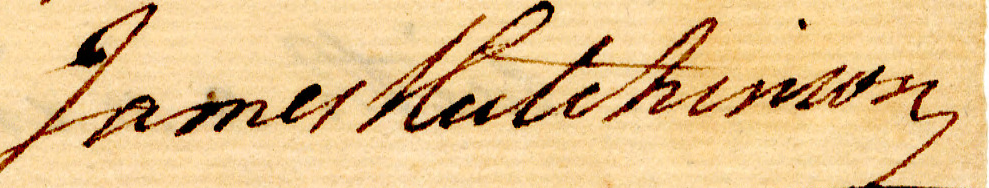James Hutchinson
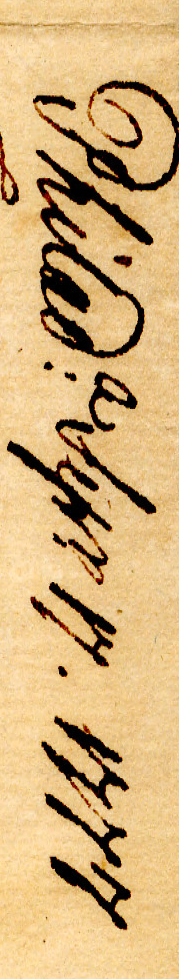Philad^a: Sep^r 17. 1777
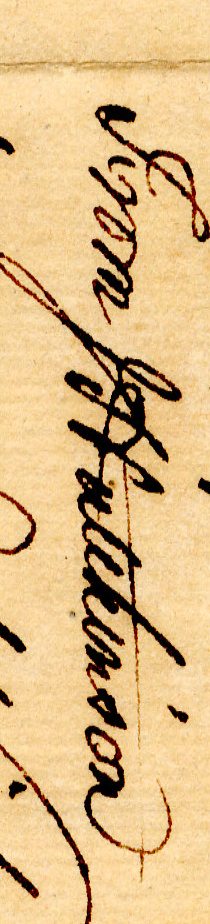From J. Hutchinson
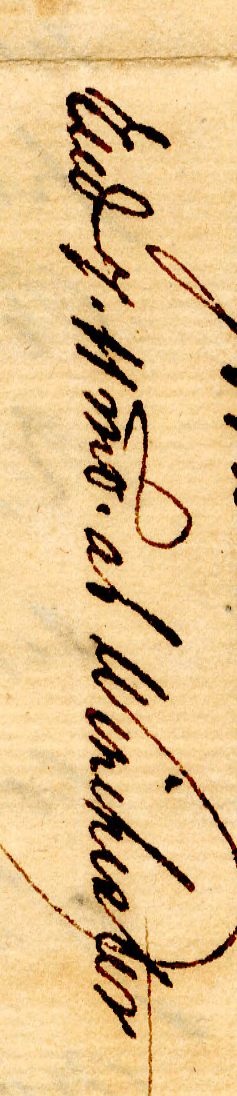recd 7. 11mo. at Winchester
